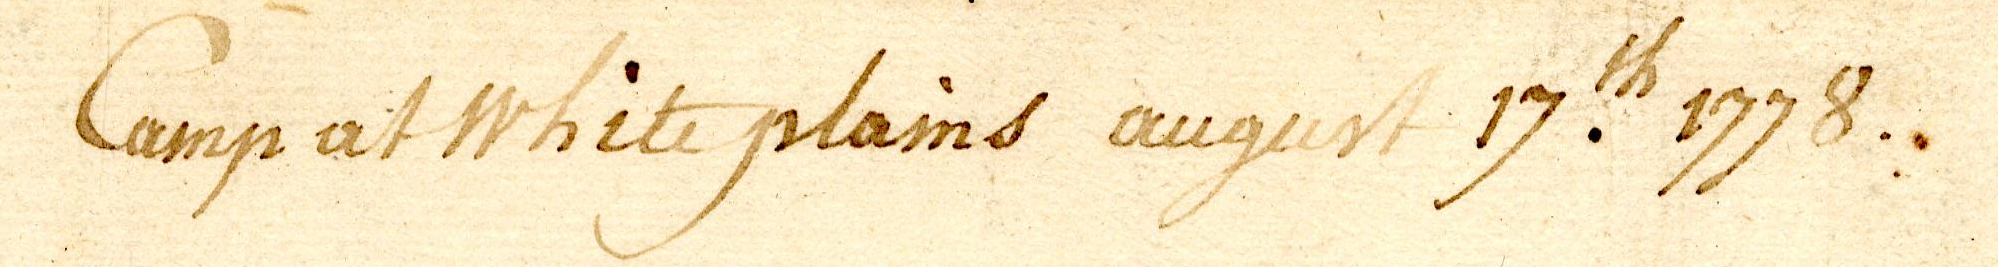Camp at White plains August 17^th. 1778.
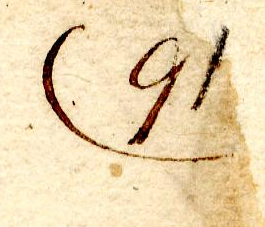91
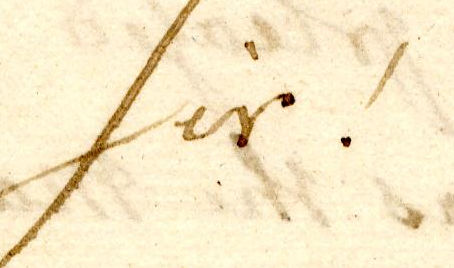Sir!
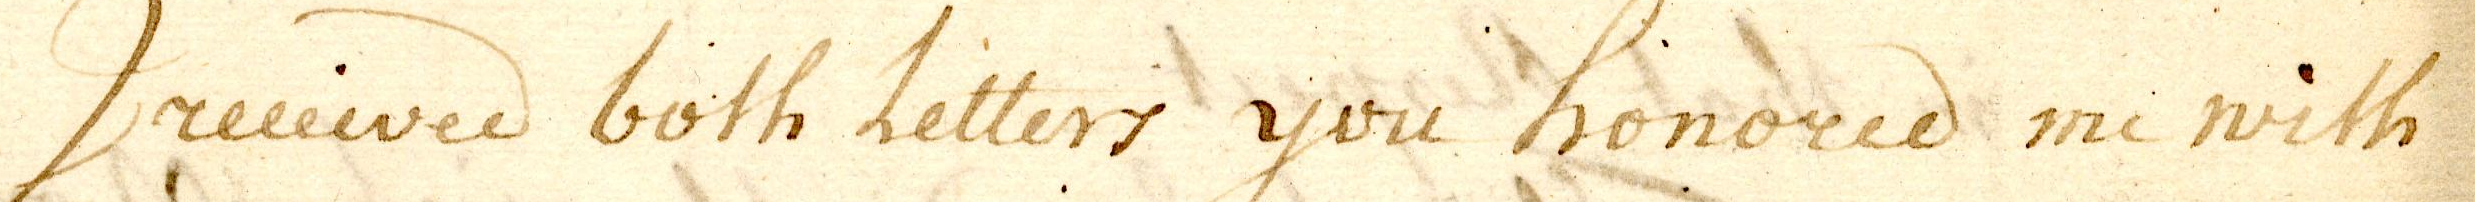I received both Letters you honored me with
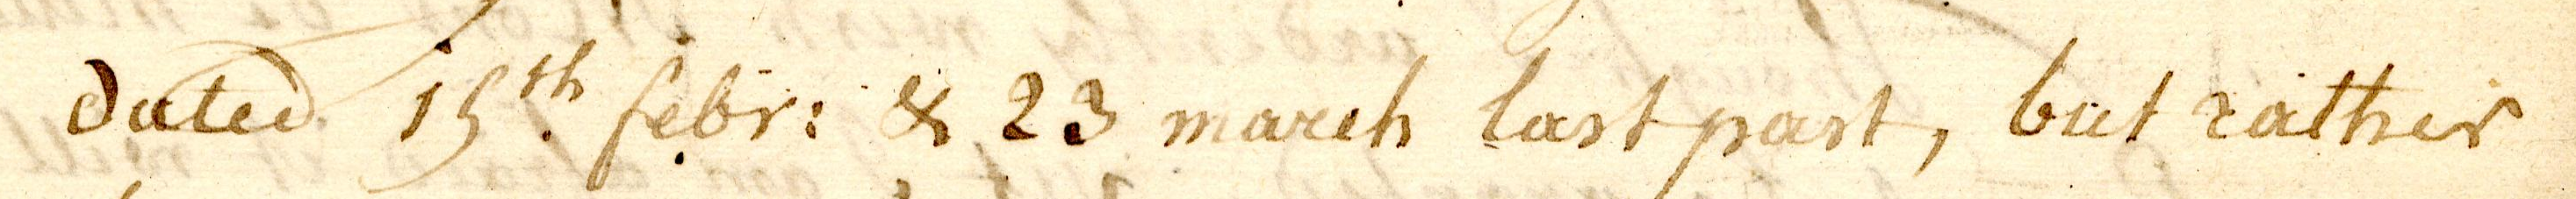Dated 15^th. febr: & 23 march last past, but rather
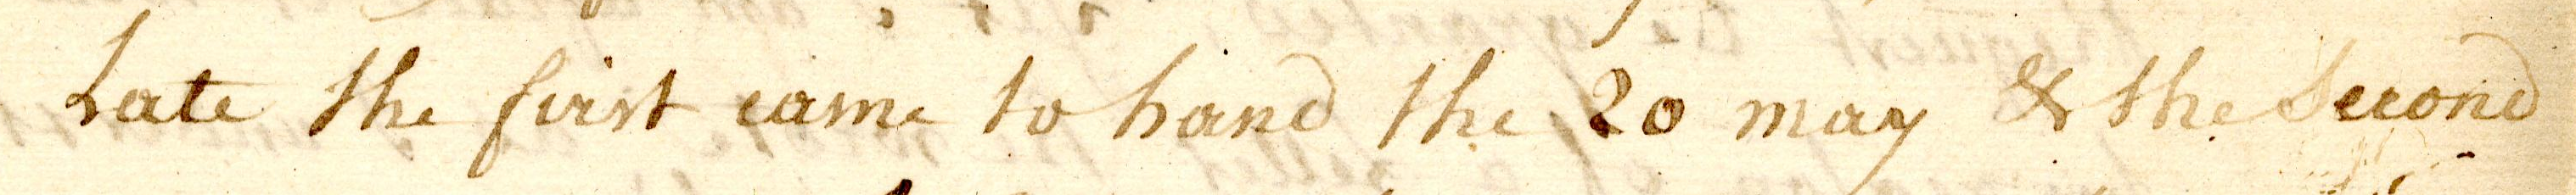Late the first came to hand the 20 may & the Second
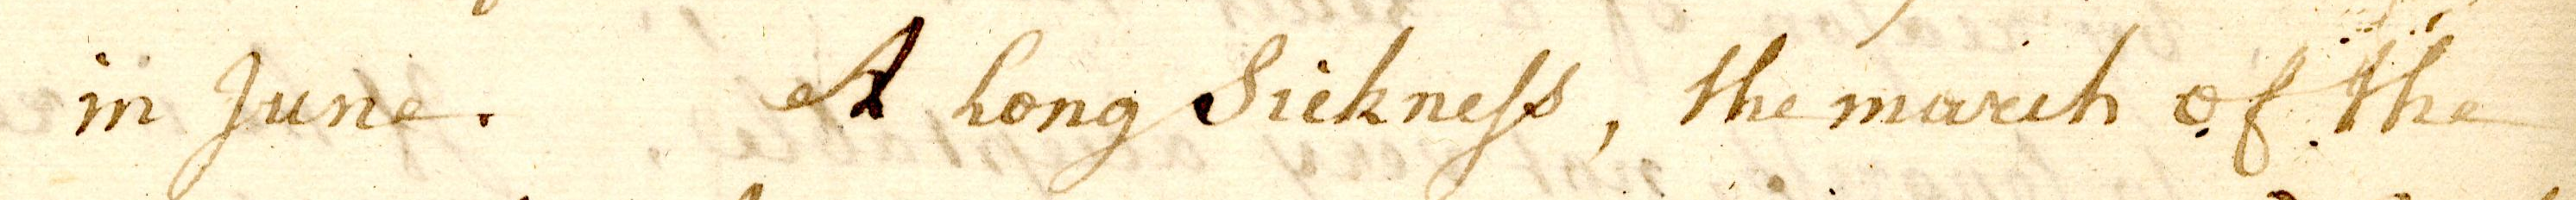in June. A long Sickness, the march of the
